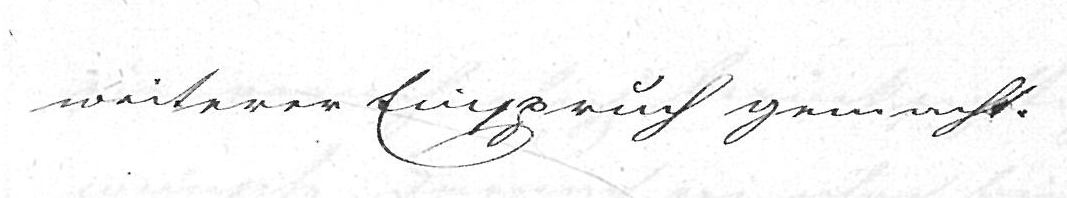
weiterer Einspruch gemacht.
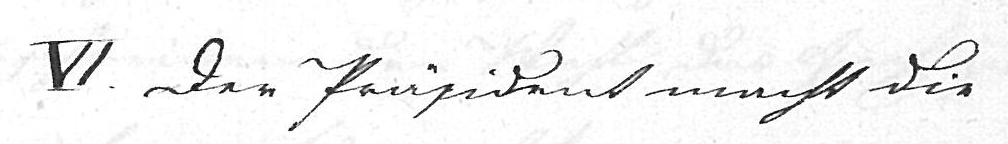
VI. Der Präsident macht die
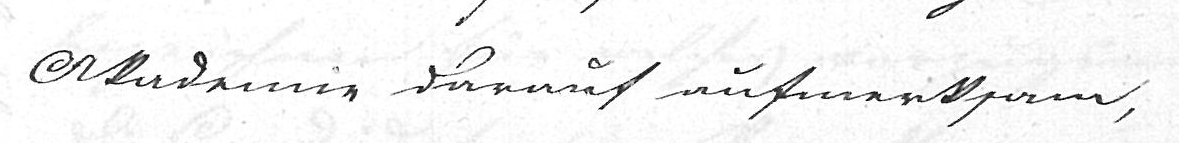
Akademie darauf aufmerksam,
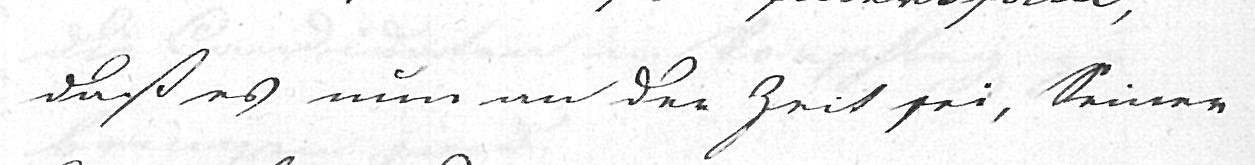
daß es nun an der Zeit sei, Seiner
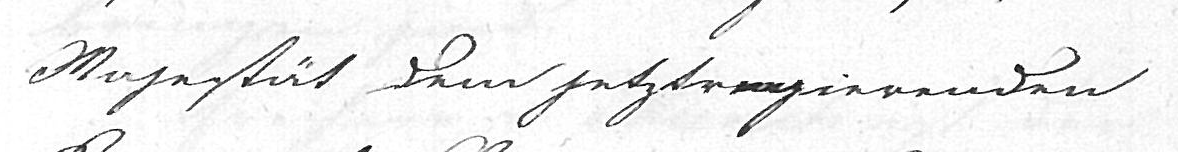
Majestät dem jetztregierenden
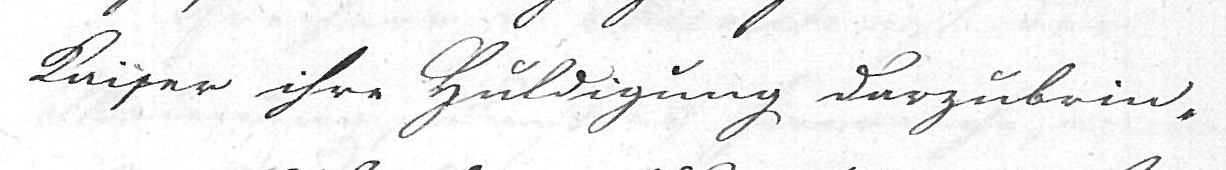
Kaiser ihre Huldigung darzubrin-
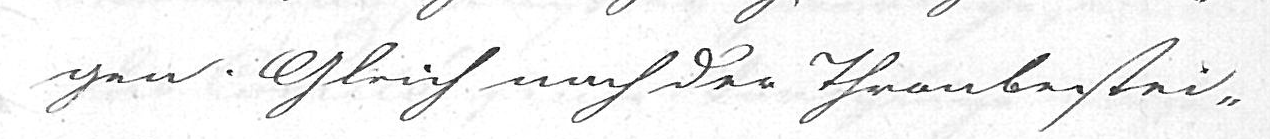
gen. Gleich nach der Thronbestei-
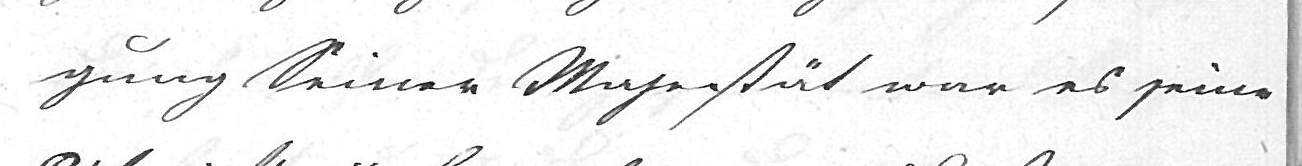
gung Seiner Majestät war es seine
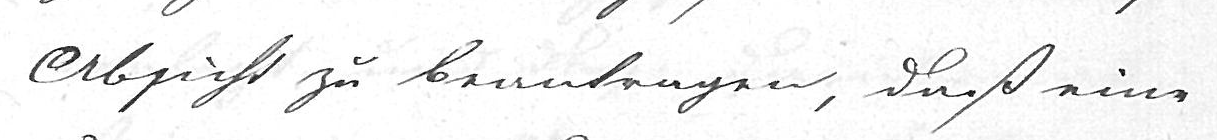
Absicht zu beantragen, daß eine
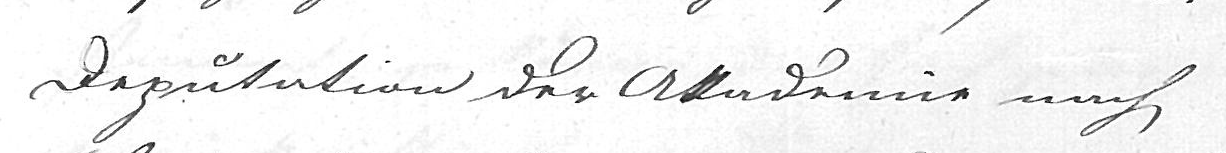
Deputation der Akademie nach
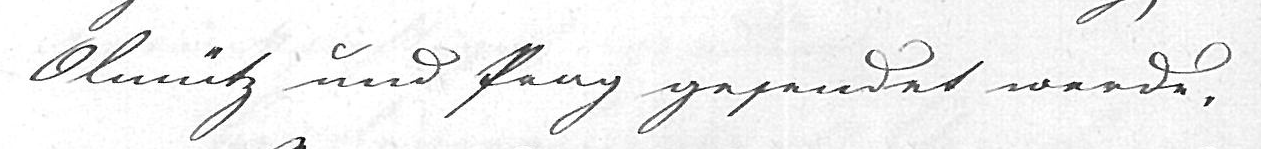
Olmütz und Prag gesendet werde,
